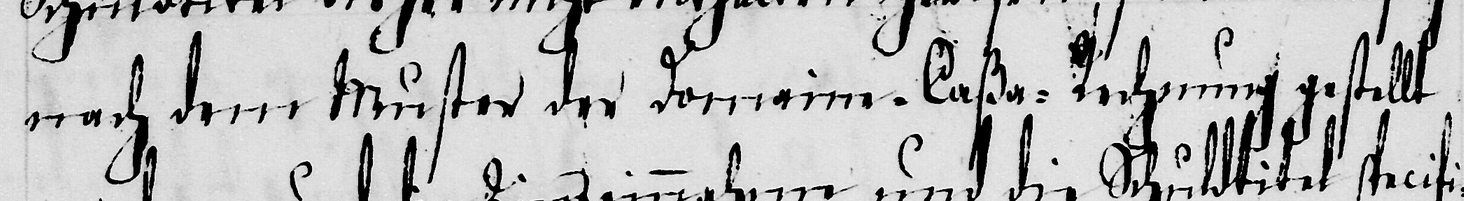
nach dem Muster der Domaine-Caßa-Rechnung gestellt
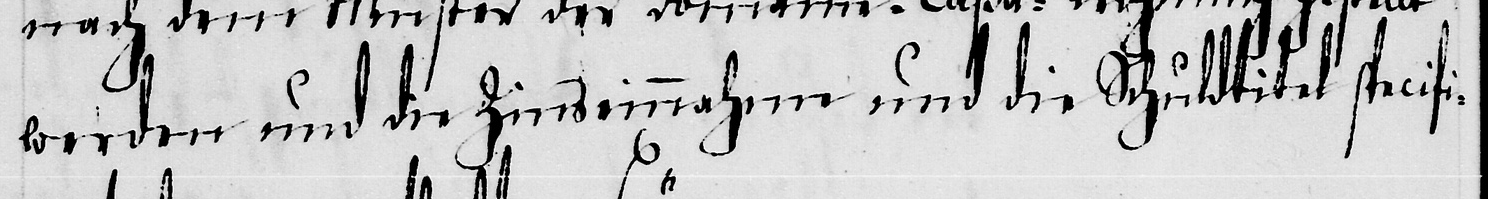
werden und die Zinseinnahme und die Schuldtitel specif¬
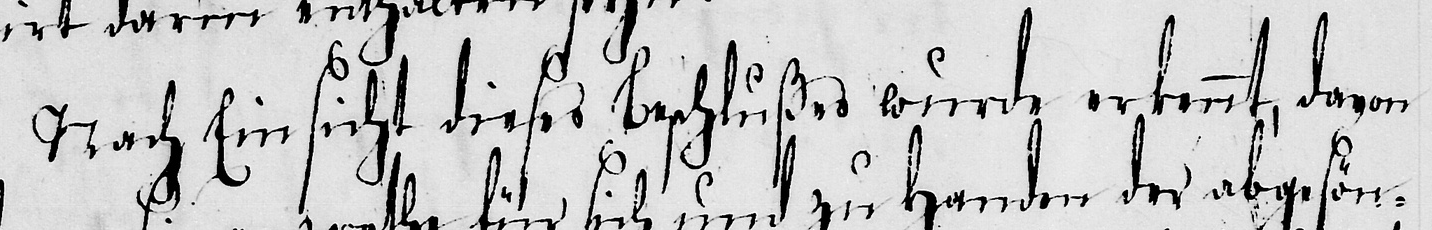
Nach Einsicht dieses Beschlußes wurde erkannt, davon
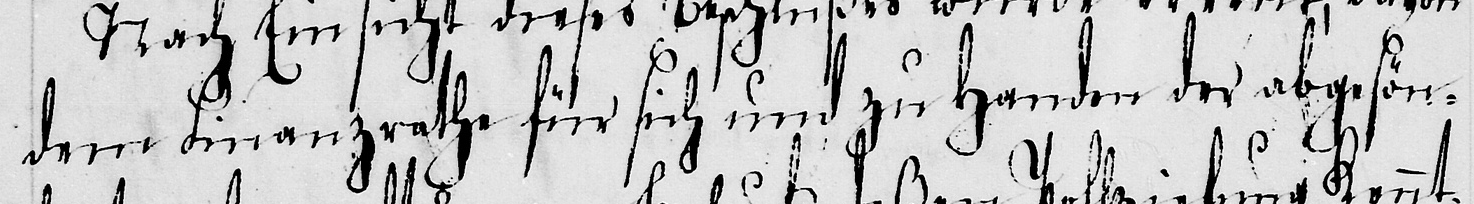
dem Finanzrathe für sich und zu Handen der abgesön¬
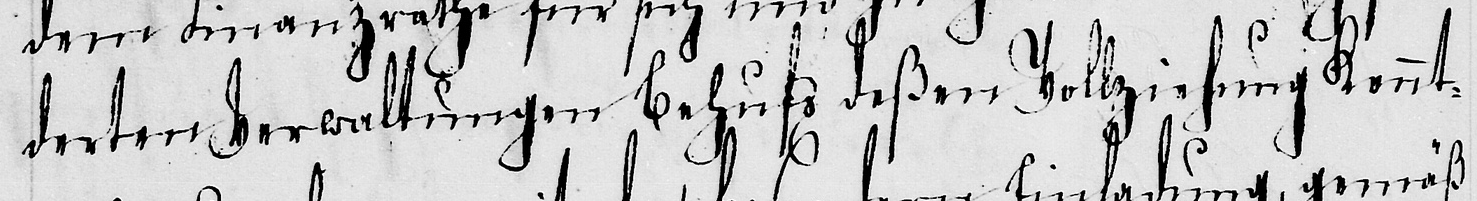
derten Verwaltungen Behufs deßen Vollziehung Kennt¬
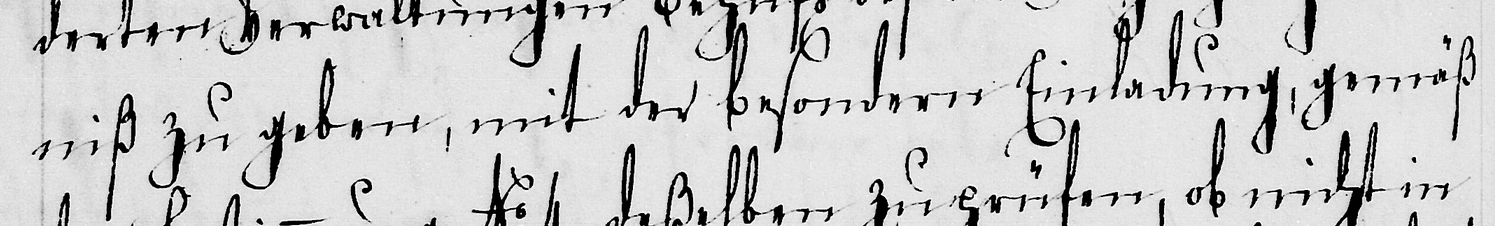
niß zu geben, mit der besondern Einladung, gemäß
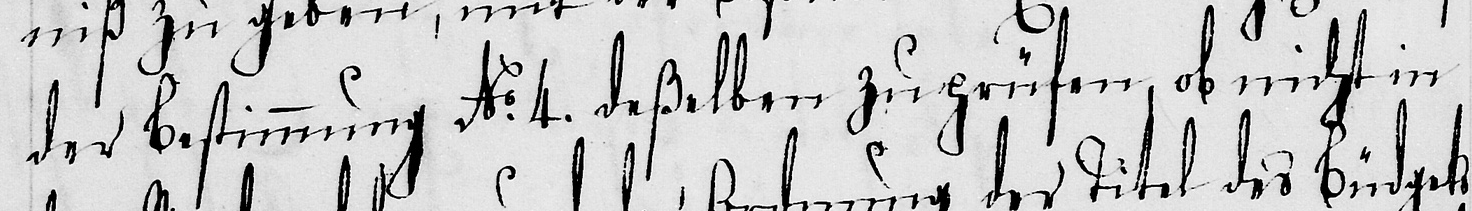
der Bestimmung N°. 4. deßelben zu prüfen, ob nicht in
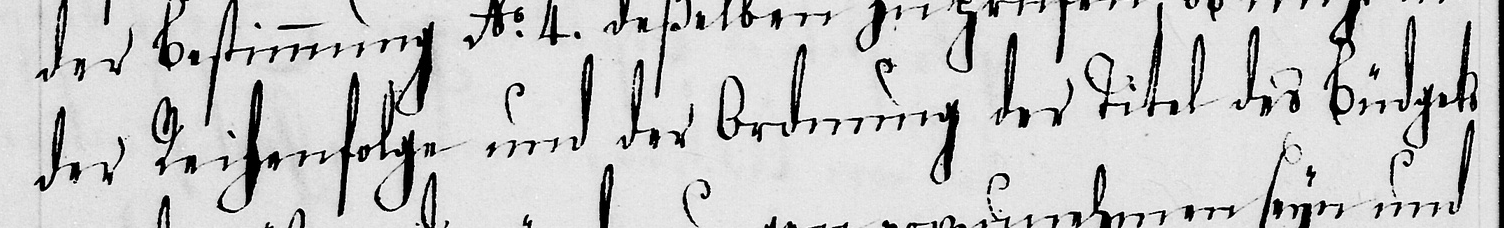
der Reihenfolge und der Ordnung der Titel des Büdgets
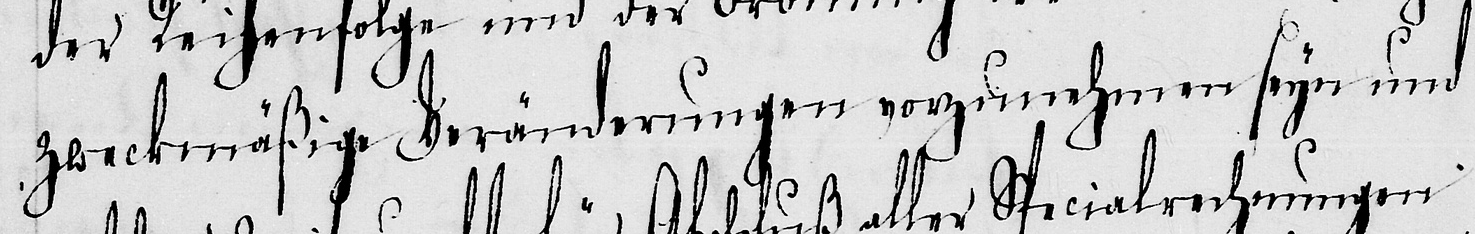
zweckmäßige Veränderungen vorzunehmen seyn und
